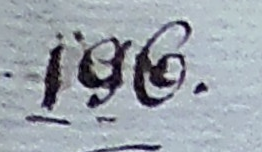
196.
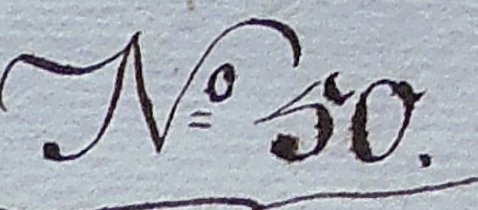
No͇ 50.
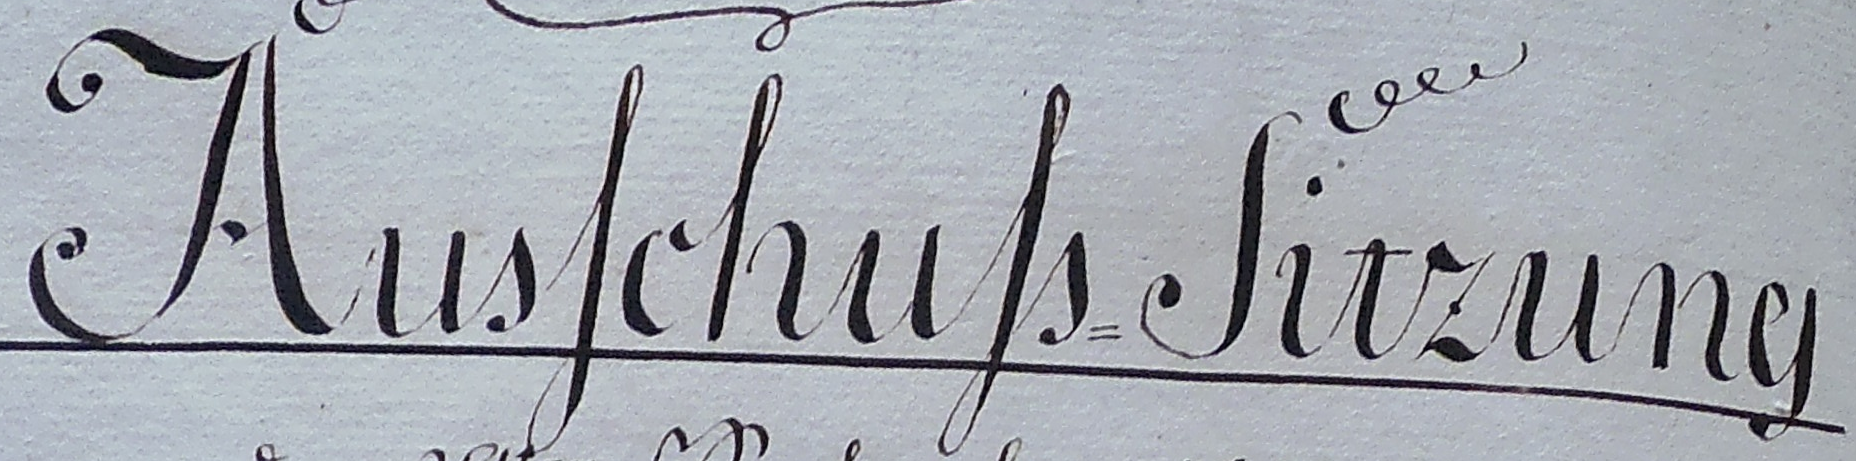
Ausschuss‗Sitzung
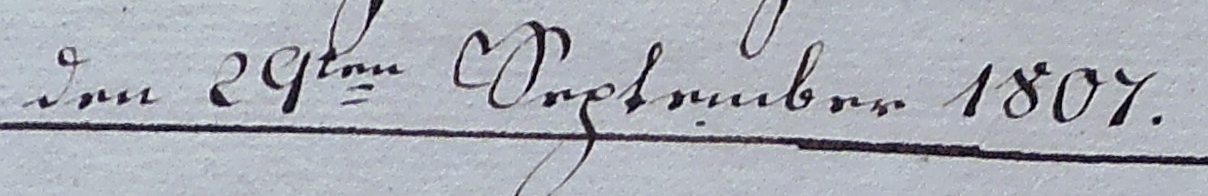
den 29te͇n September 1807.
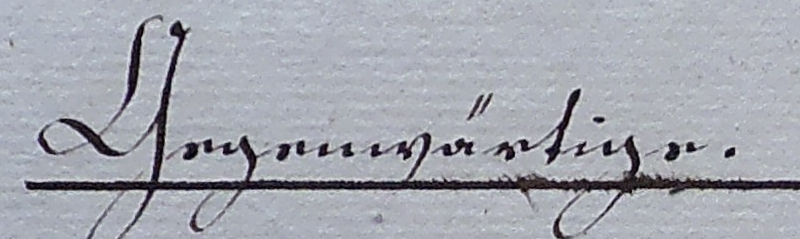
Gegenwärtige.
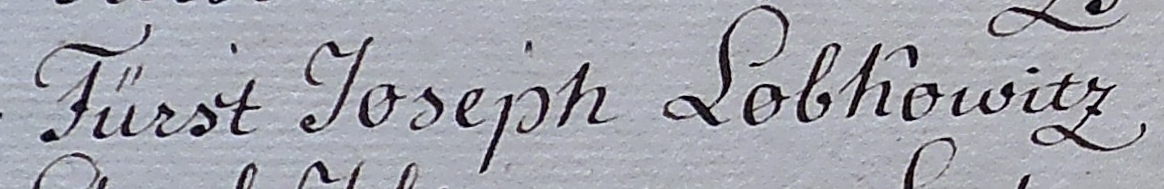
Fürst Joseph Lobkowitz
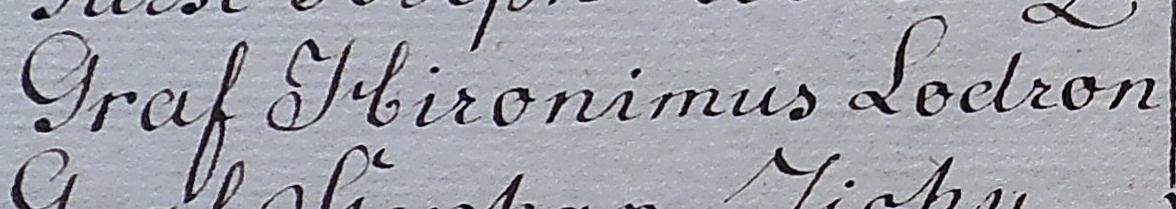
Graf Hironimus Lodron
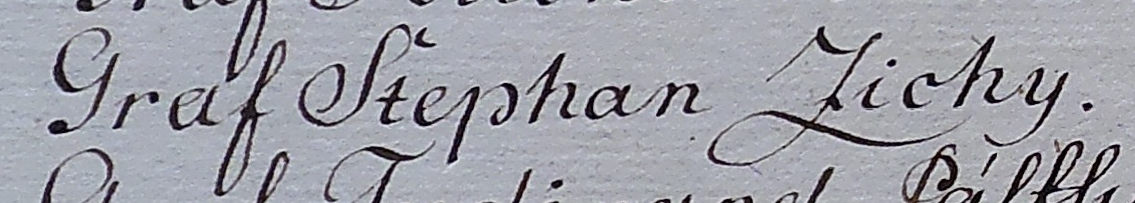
Graf Stephan Zichy.
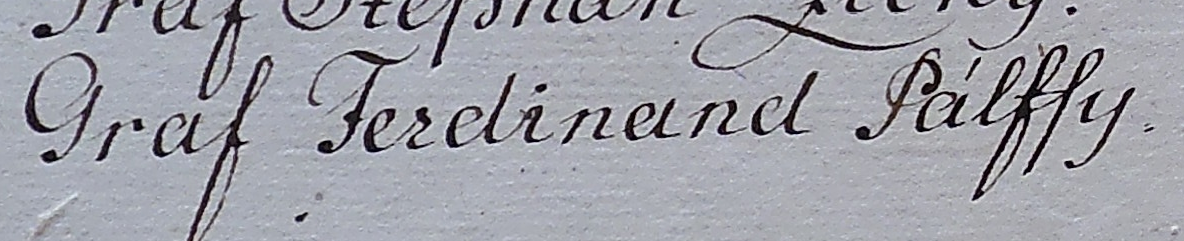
Graf Ferdinand Pálffy
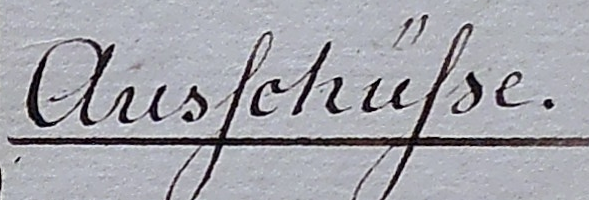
Ausschüsse.
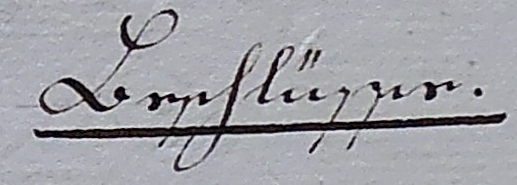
Beschlüsse.
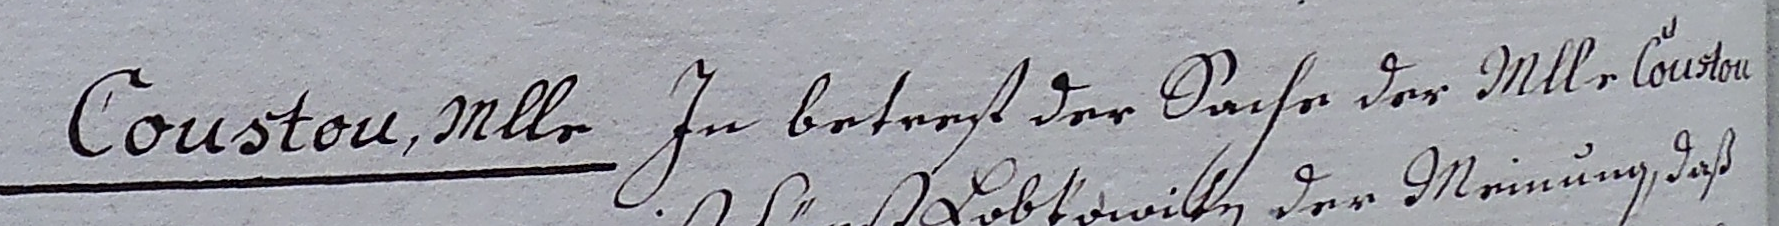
Coustou, Mlle. In betref der Sache der Mlle Coustou
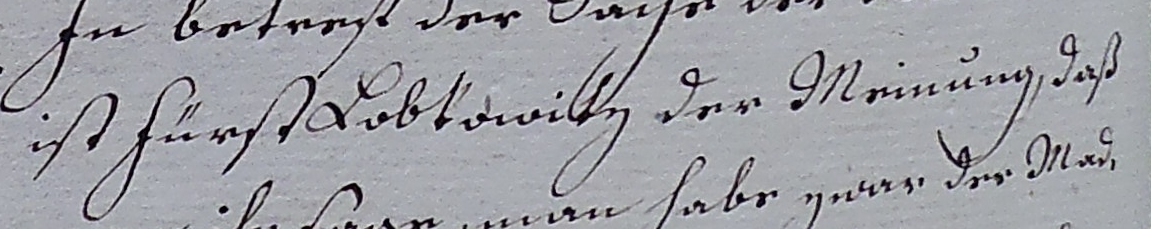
ist Fürst Lobkowitz der Meinung, daß
